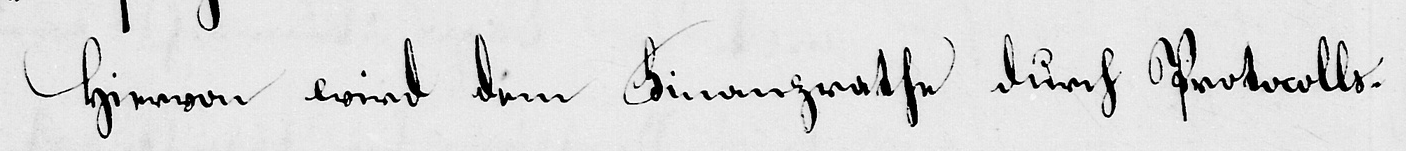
Hiervon wird dem Finanzrathe durch Protocolls¬
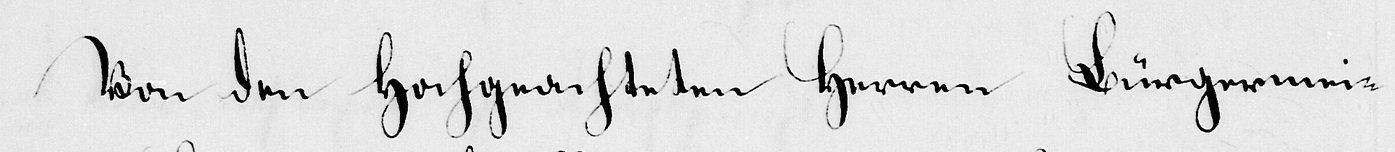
Von den Hochgeachteten Herren Bürgermei¬
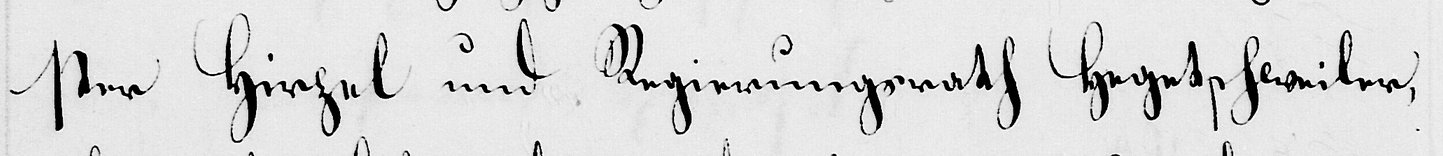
ster Hirzel und Regierungsrath Hegetschweiler,
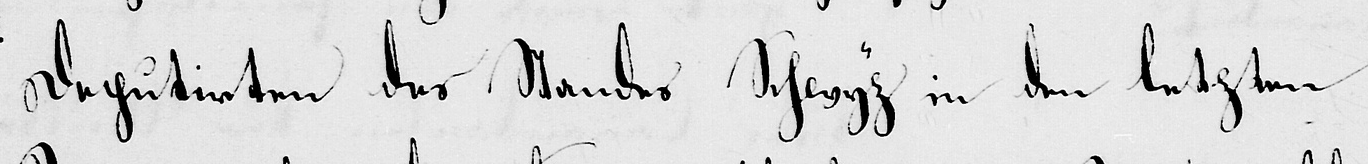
Deputirten des Standes Schwyz in den letzten
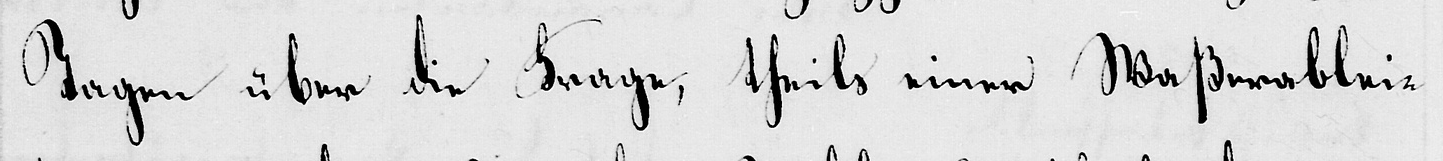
Tagen über die Frage, theils einer Waßerablei¬
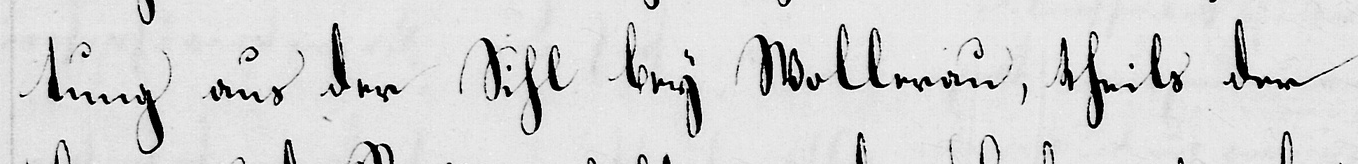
tung aus der Sihl bey Wollerau, theils der
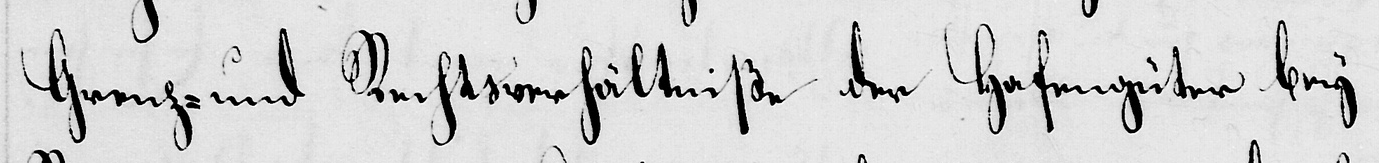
Grenz- und Rechtsverhältniße der Hafengüter bey
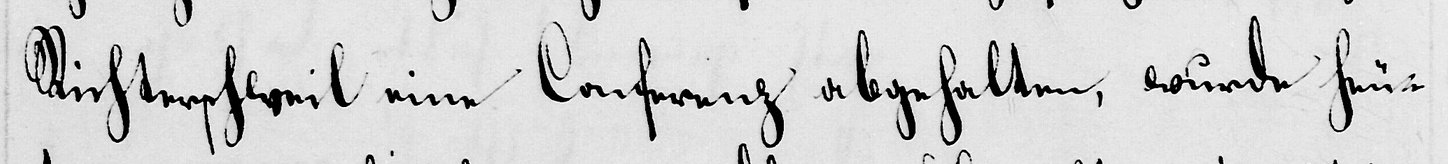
Richterschweil eine Conferenz abgehalten, wurde heu¬
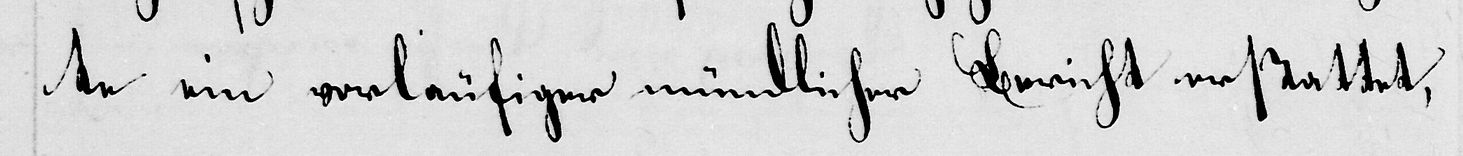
te ein vorläufiger mündlicher Bericht erstattet,
